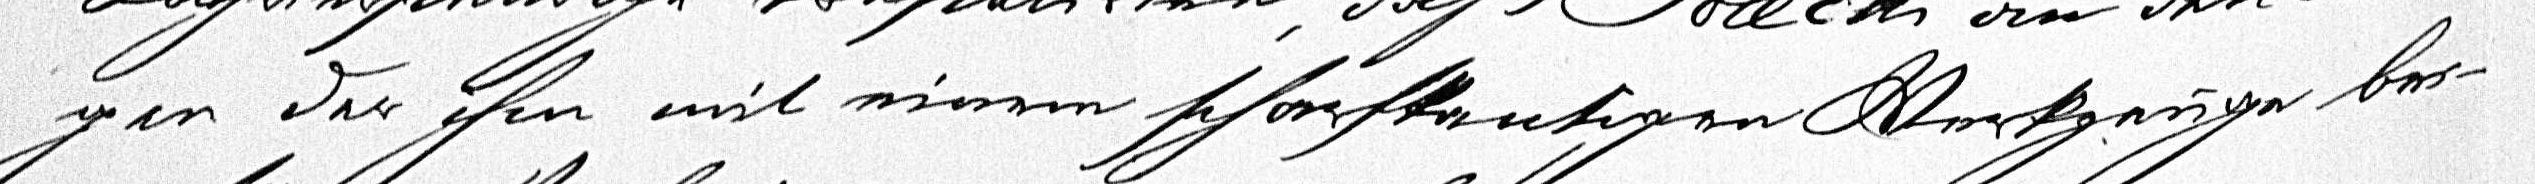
gen der ihm mit einem scharfkantigen Werkzeuge bei¬
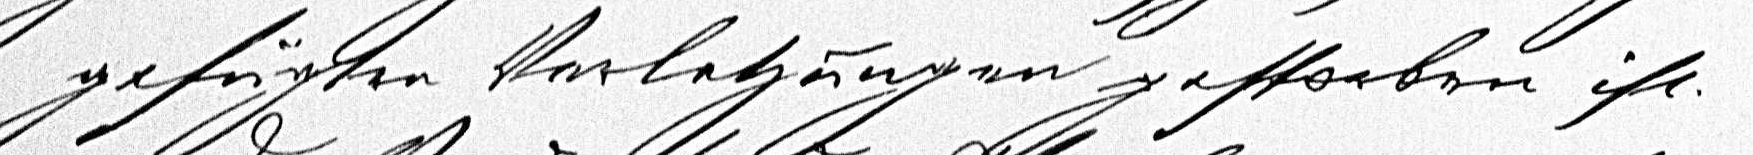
gefügten Verletzungen gestorben ist.
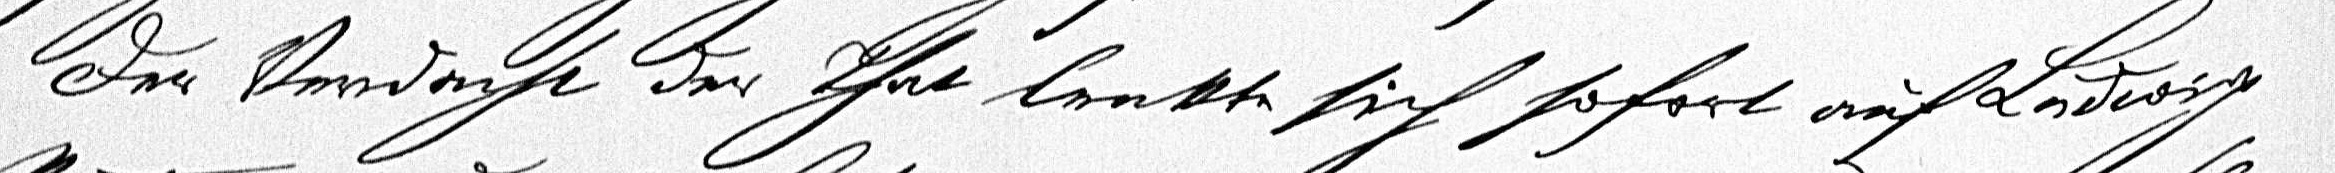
Der Verdacht der That lenkte sich sofort auf Ludwig
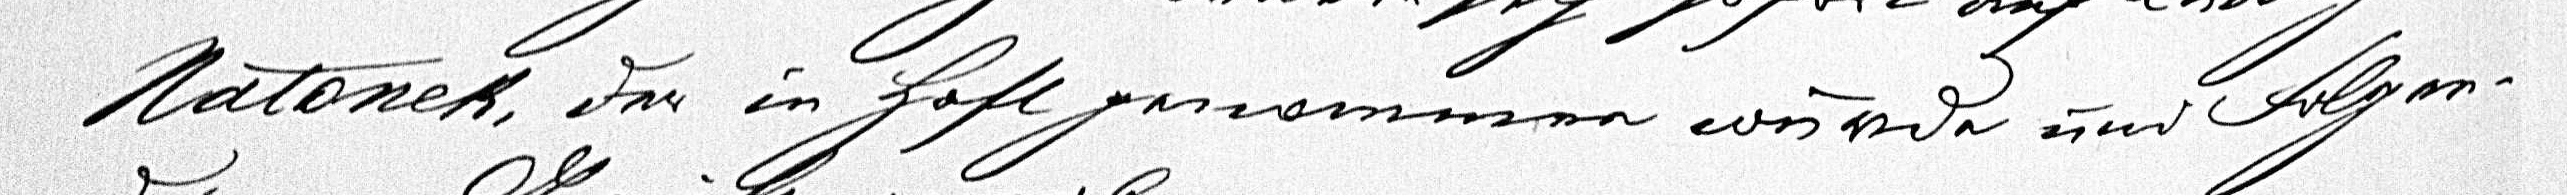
Natonek, der in Haft genommen wurde und folgen¬
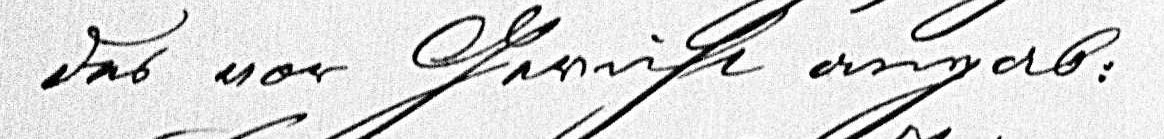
des vor Gericht angab:
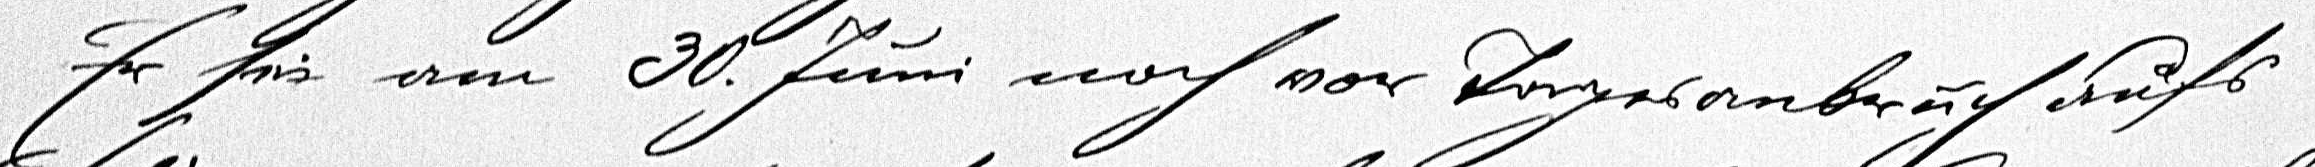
Er sei am 30. Juni noch vor Tagesanbruch aufs
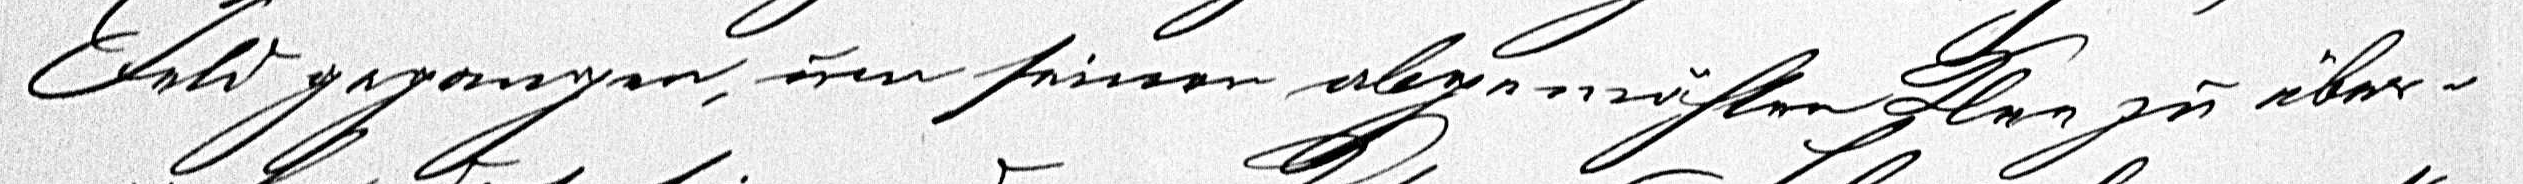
Feld gegangen, um seinen abgemähten Klee zu über¬
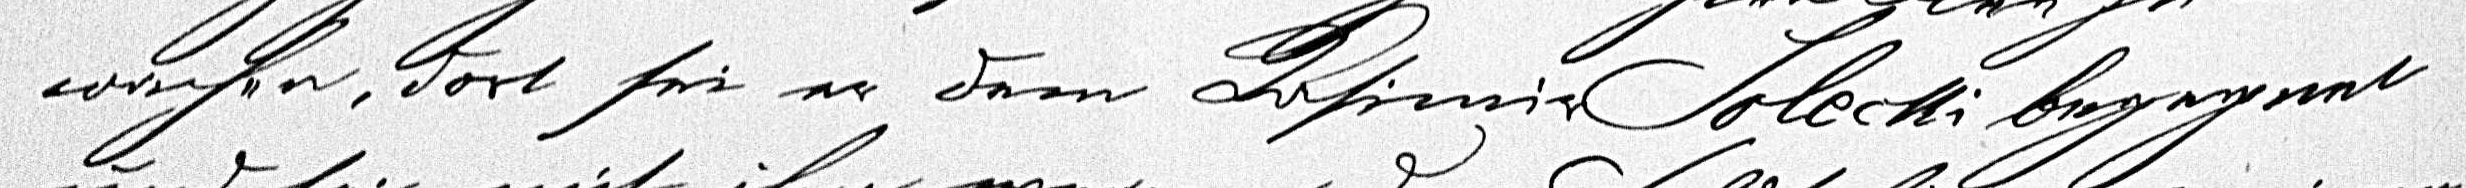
wachen, dort sei er dem Kasimir Solecki begegnet
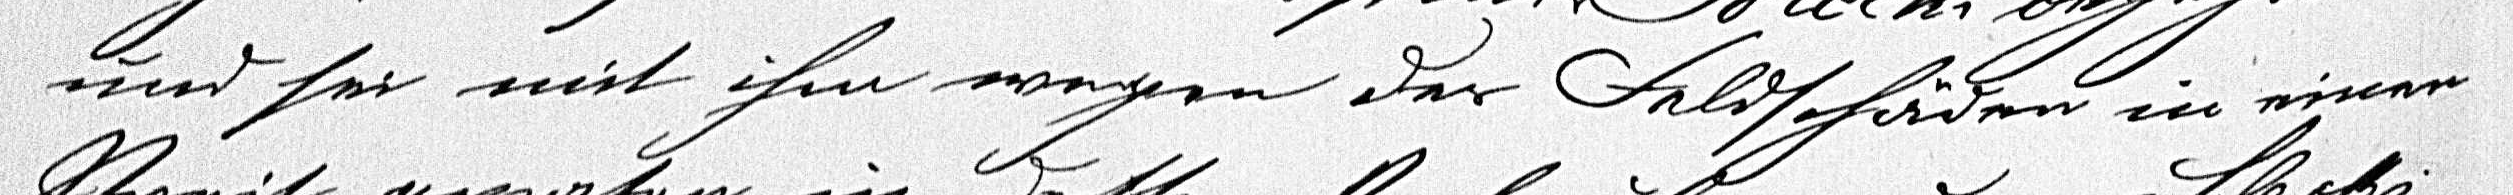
und sei mit ihm wegen der Feldschäden in einen
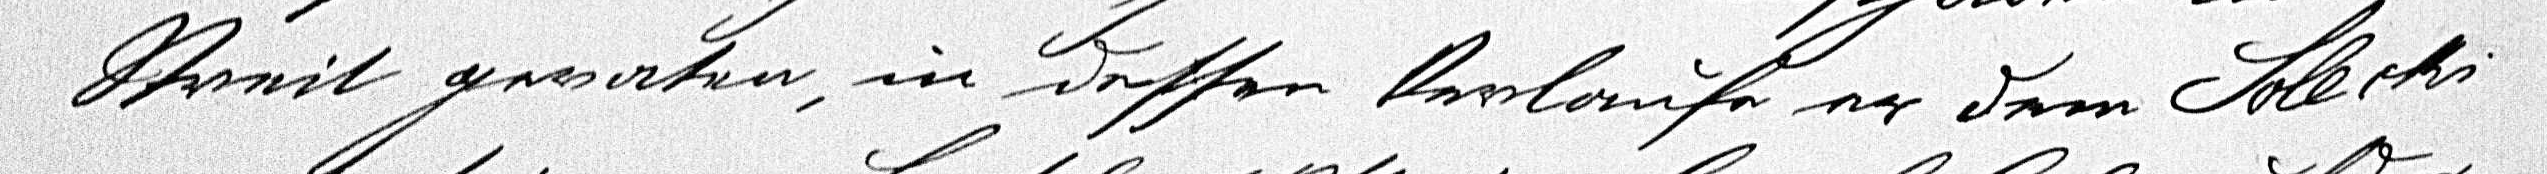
Streit geraten, in dessen Verlaufe er dem Solecki
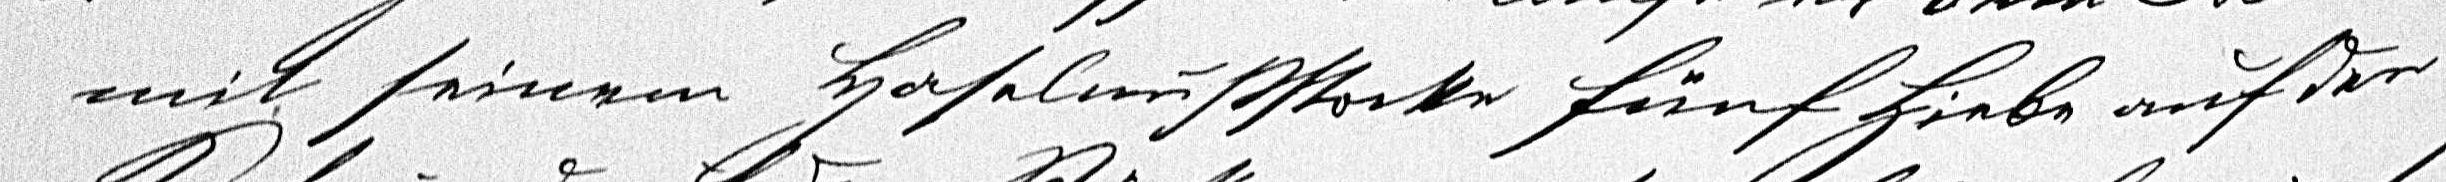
mit seinem Haselnußstocke fünf Hiebe auf den
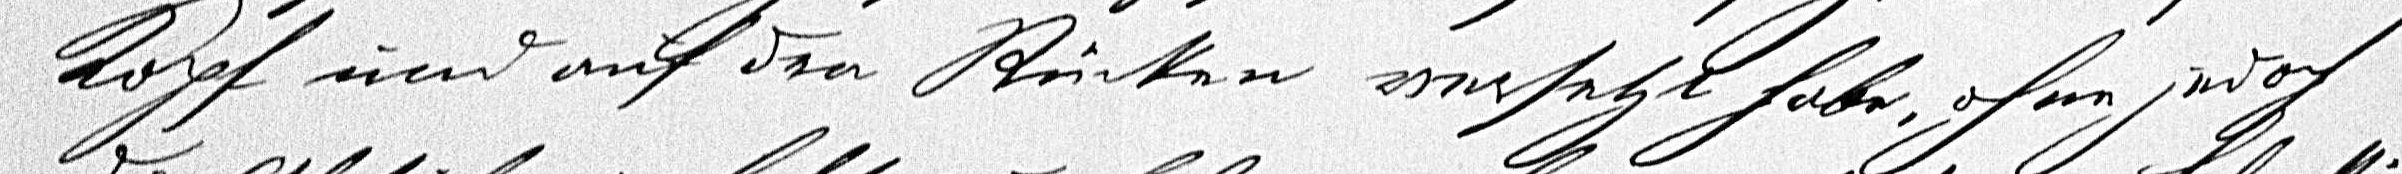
Kopf und auf der Rücken versetzt habe, ohne jedoch
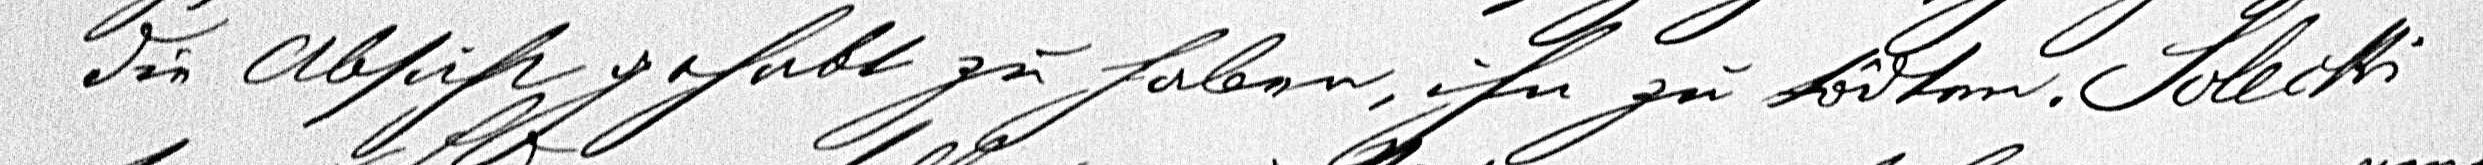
die Absicht gehabt zu haben, ihn zu tödten. Solecki
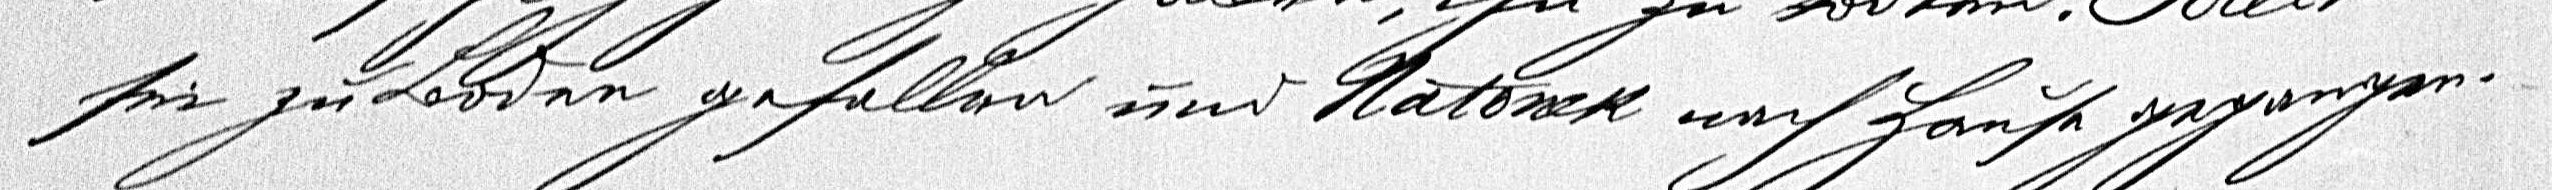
sei zu Boden gefallen und Natonek nach Hause gegangen.
